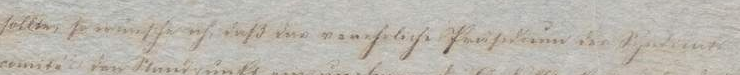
sollte, so wünsche ich, daß das verehrliche Präsidium des Syndicats-
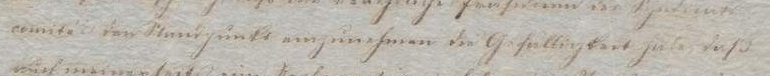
comité's den Standpunkt einzunehmen die Gefälligkeit habe, daß
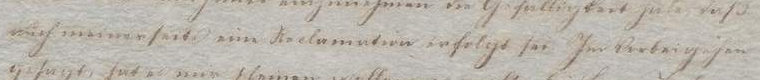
auch meinerseits eine Reclamation erfolgt sei. Im Vorbeigehen
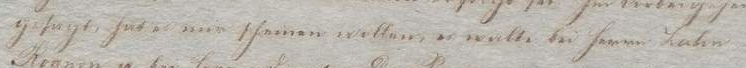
gesagt, hat es mir scheinen wollen, es walte bei Herrn Zahn
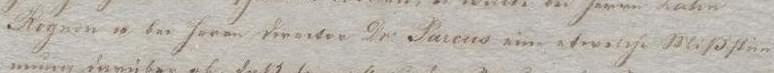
Rognon & bei Herrn Director Dr. Parcus eine etwelche Mißstim-
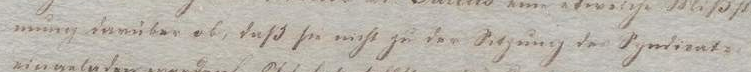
mung darüber ob, daß sie nicht zu der Sitzung des Syndicats
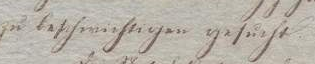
zu beschwichtigen gesucht.
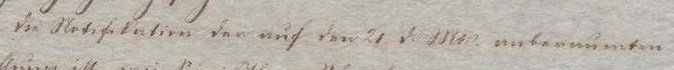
Die Notifikation der auf den 21 d. Mts. anberaumten
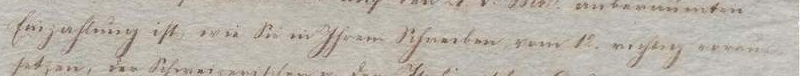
Einzahlung ist, wie Sie in Ihrem Schreiben vom 12. richtig voraus-
